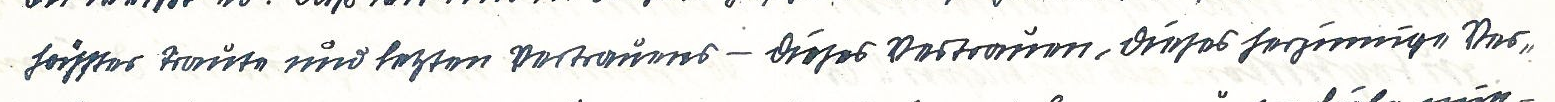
höchster Traute und letzten Vertrauens – dieses Vertrauen, dieses herzinnige Ver¬
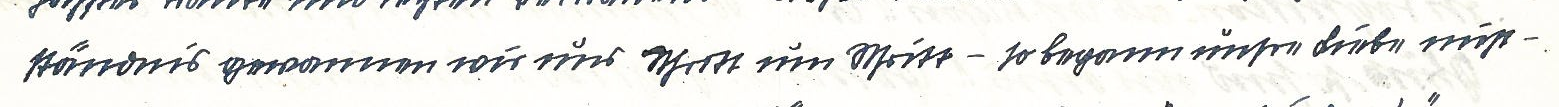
ständnis gewannen wir uns Schritt um Schritt – so begann unsre Liebe nicht –
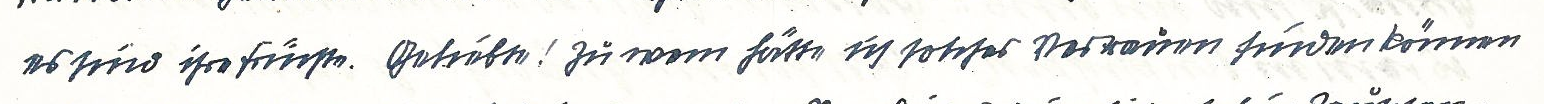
es sind ihre Früchte. Geliebte! Zu wem hätte ich solches Vertrauen finden können
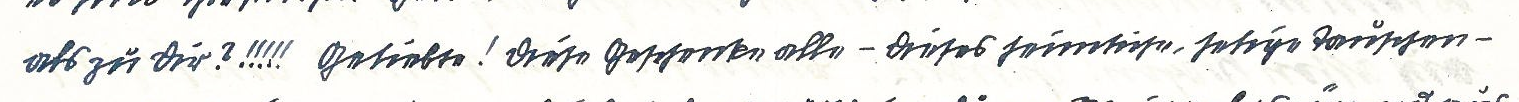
als zu Dir?!!!!! Geliebte! Diese Geschenke alle – dieses heimliche, selige Tauschen –
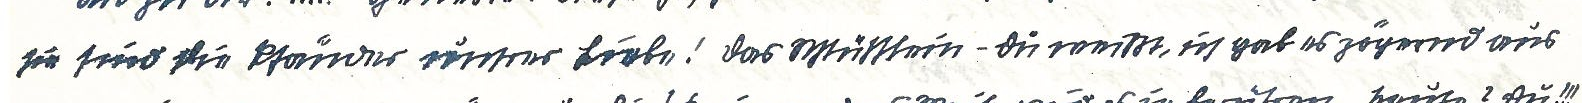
sie sind die Pfänder unsrer Liebe! Das Schlüsslein – Du weißt, ich gab es zögernd aus
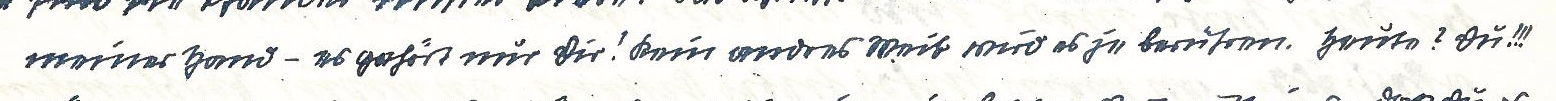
meiner Hand – es gehört nur Dir! Kein andres Weib wird es je berühren. Heute? Du!!!
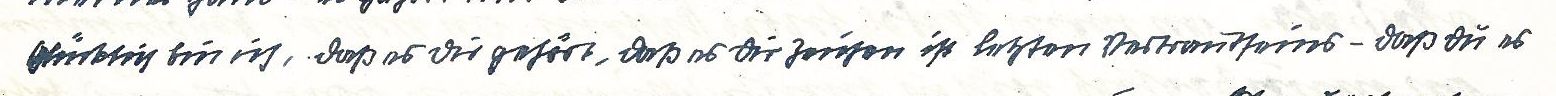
Glücklich bin ich, daß es Dir gehört, daß es Dir Zeichen ist letzten Vertrautseins – daß Du es
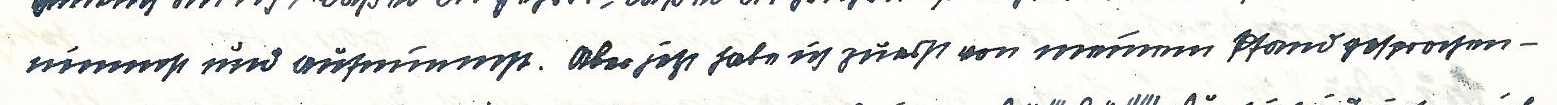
nimmst und aufnimmst. Aber jetzt habe ich zuerst von meinem Pfand gesprochen –
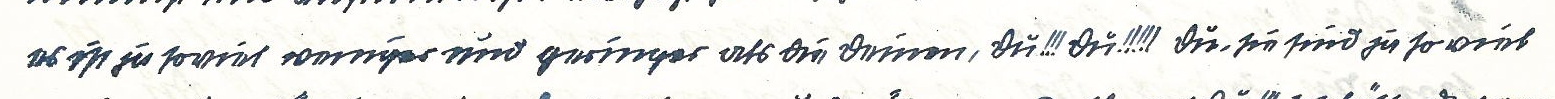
es ist ja so viel weniger und geringer als die Deinen, Du!!! Du!!!!! Du, sie sind ja so viel
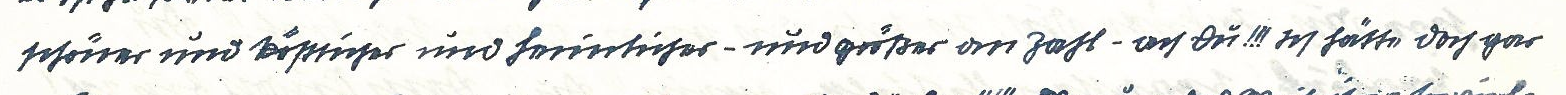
schöner und köstlicher und heimlicher – und größer an der Zahl – ach Du!!! Ich hätte doch gar
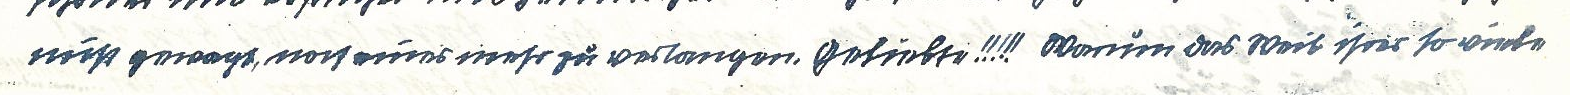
nicht gewagt, noch eines mehr zu verlangen. Geliebte!!!!! Warum das Weib ihrer so viele
